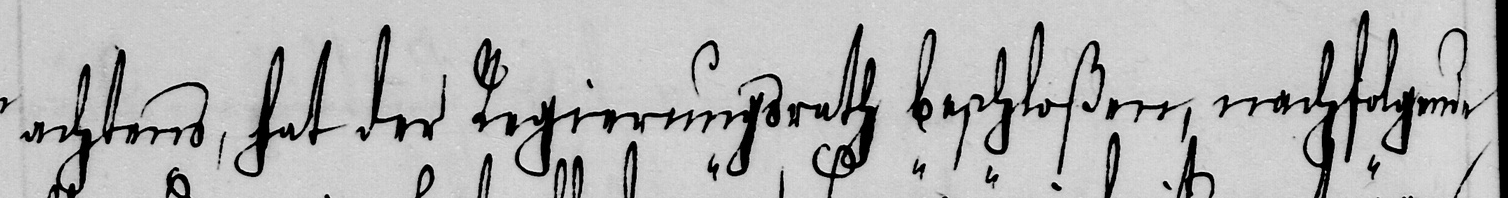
achtens, hat der Regierungsrath beschloßen, nachfolge¬
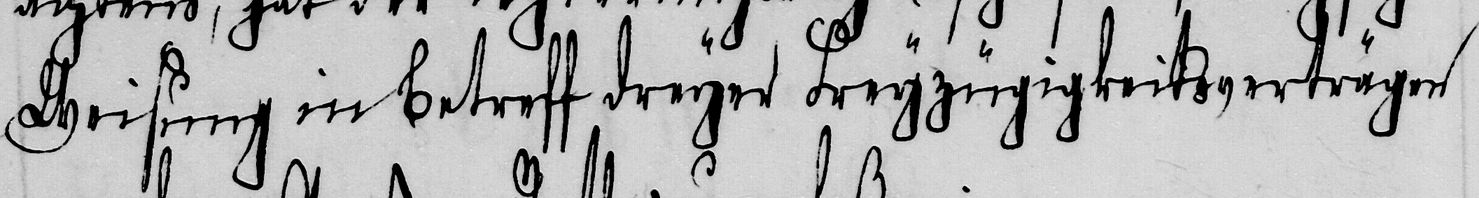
Weisung in Betreff dreyer Freyzügigkeitsverträgen
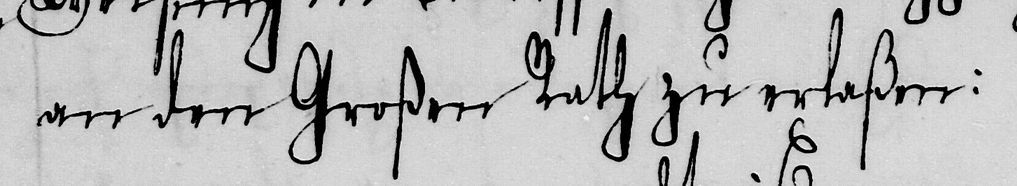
an den Großen Rath zu erlaßen:
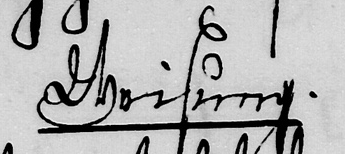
Weisung.
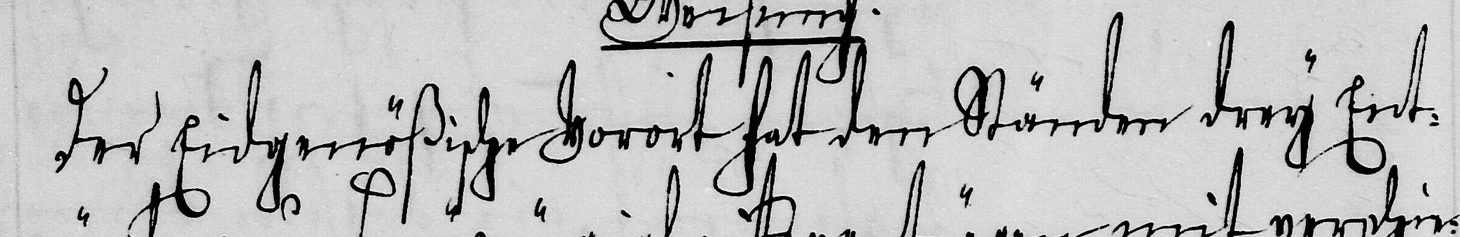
Der Eidgenößische Vorort hat den Ständen drey Ent¬
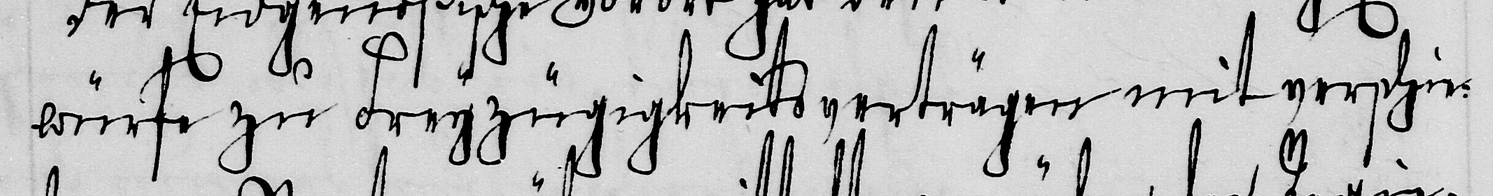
würfe zu Freyzügigkeitsverträgen mit verschie¬
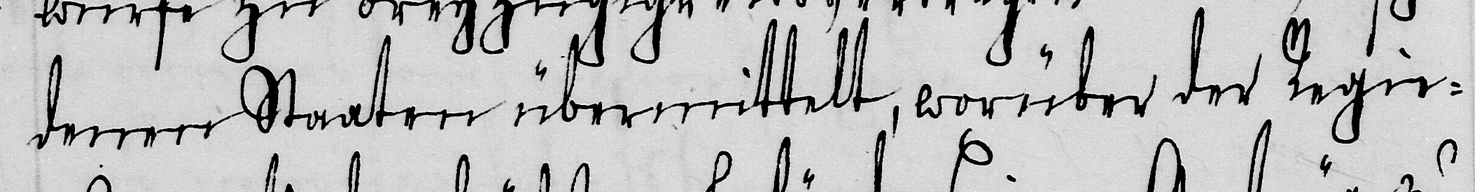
denen Staaten übermittelt, worüber der Regie¬
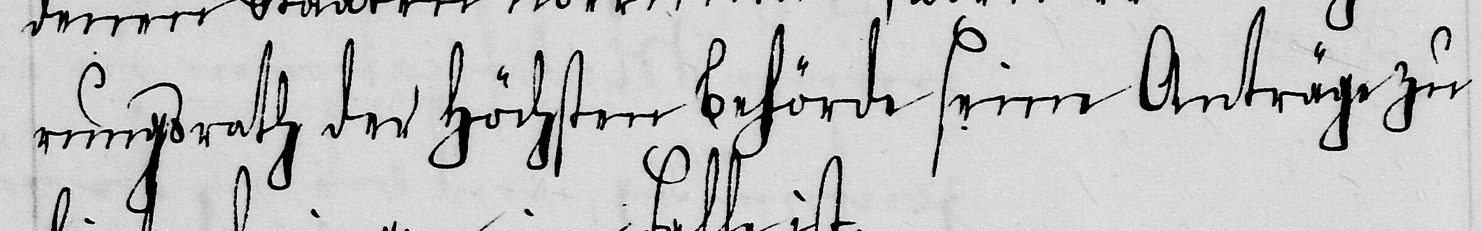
rungsrath der Höchsten Behörde seine Anträge zu
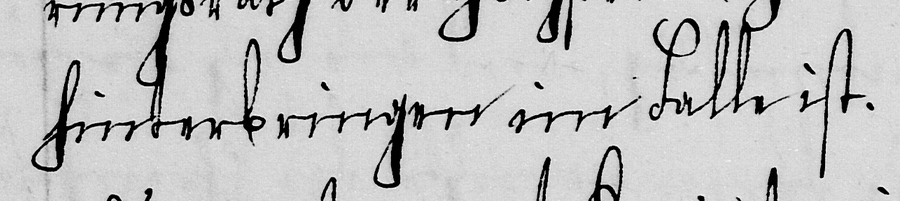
hinterbringen im Falle ist.
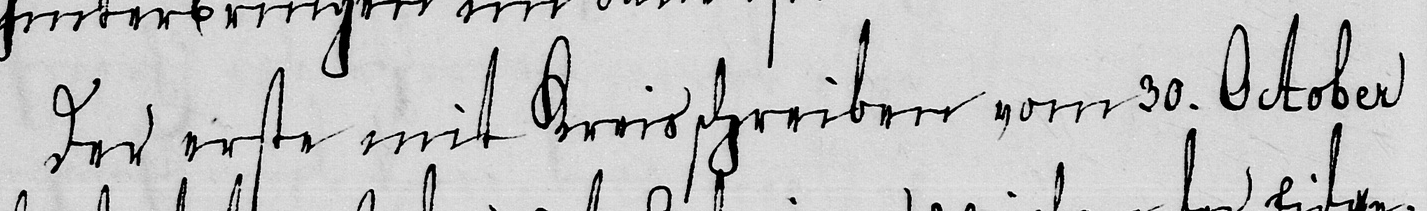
Der erste mit Kreisschreiben vom 30. October
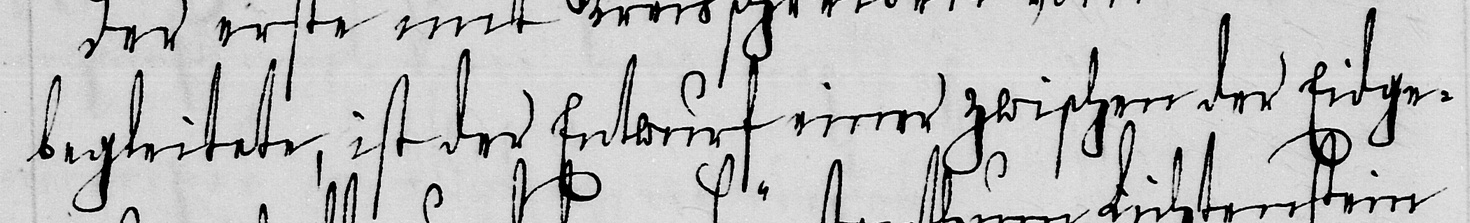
begleitete, ist der Entwurf einer zwischen der Eidge¬
